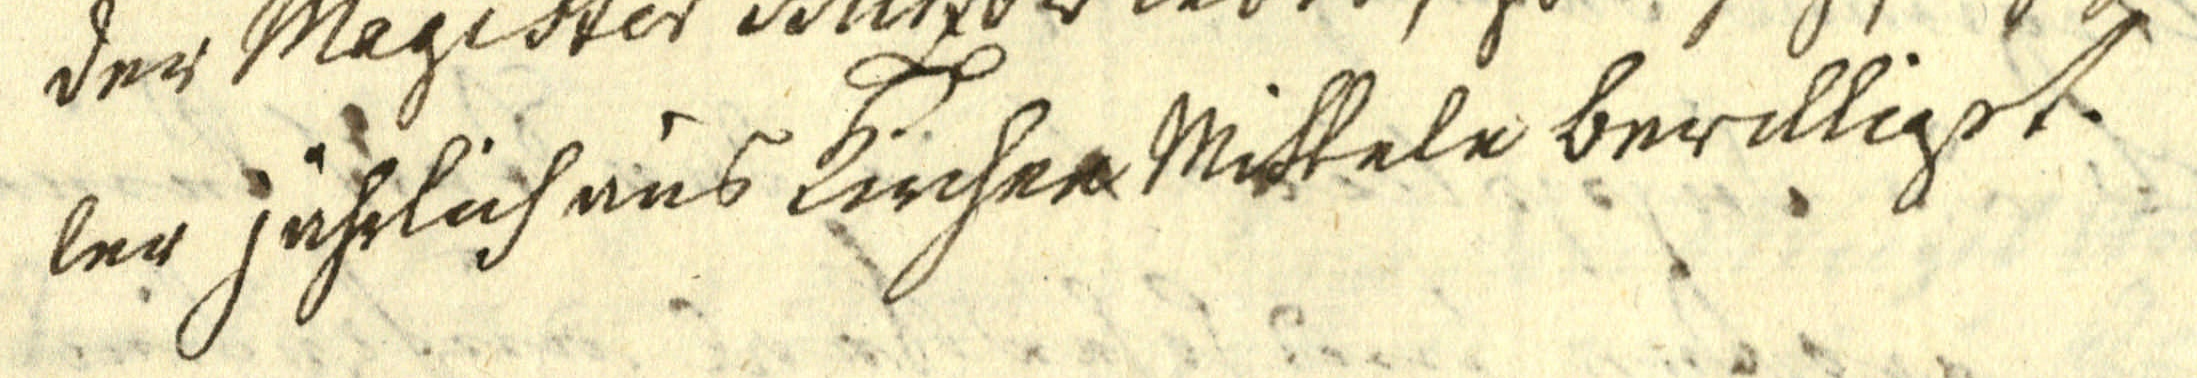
ler jährlich aus Kirchen Mitteln bewilliget.
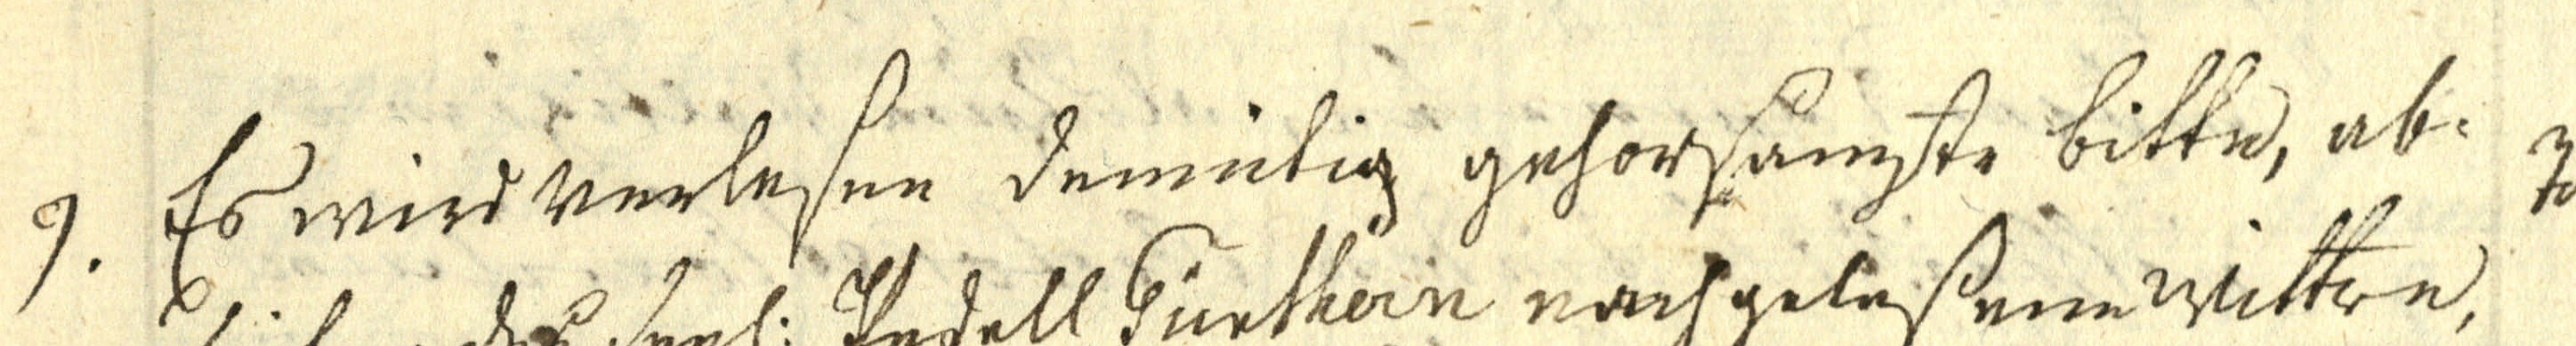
9. Es wird verlesen demütig gehorsamste Bitte, ab¬
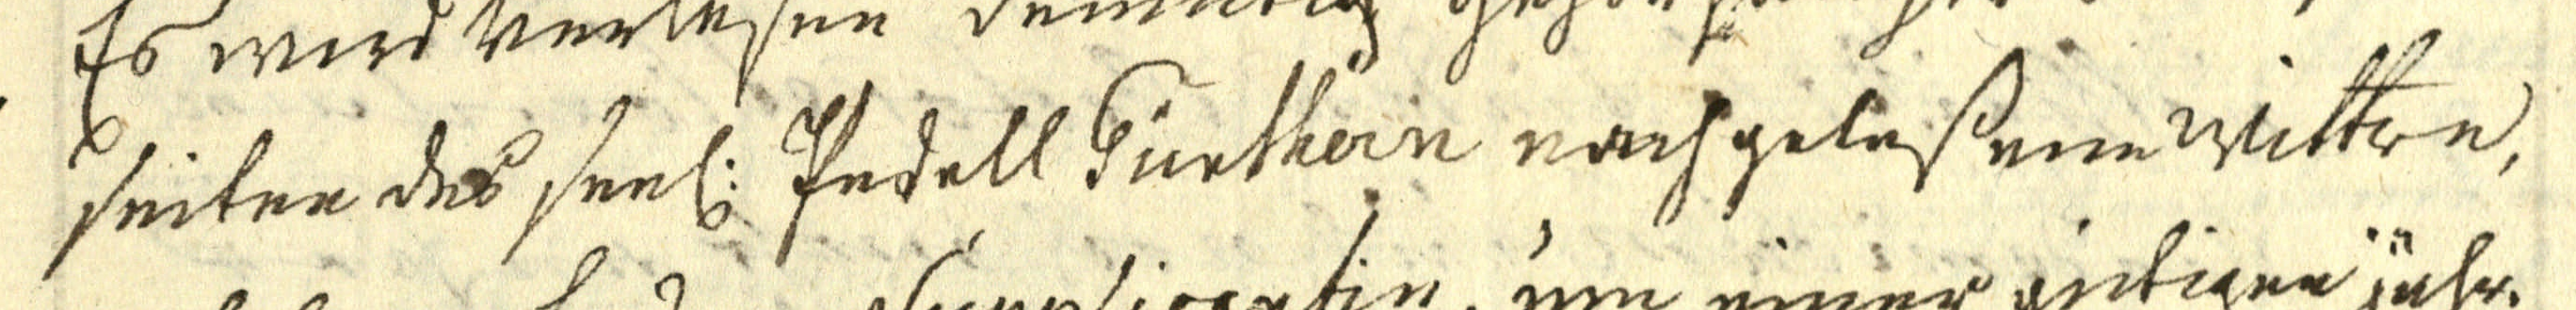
seiten des seel. Pedell Gurterin nach gelaßene Wittwe,
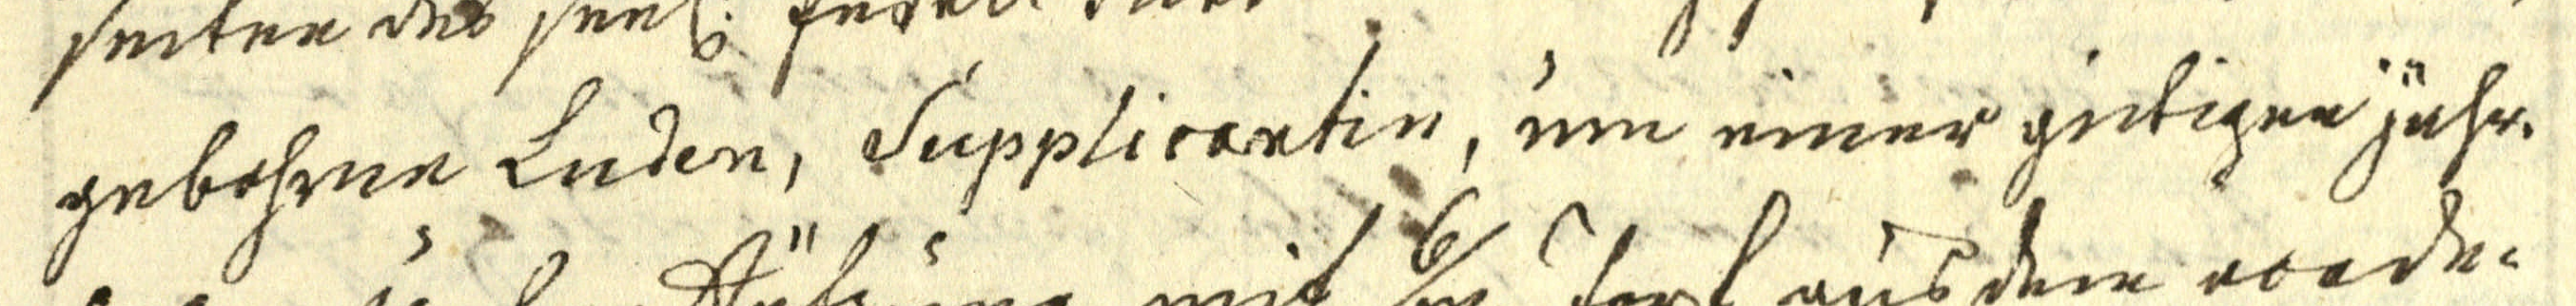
gebohrne Luden, Supplicantin, um einer gütigen jähr¬
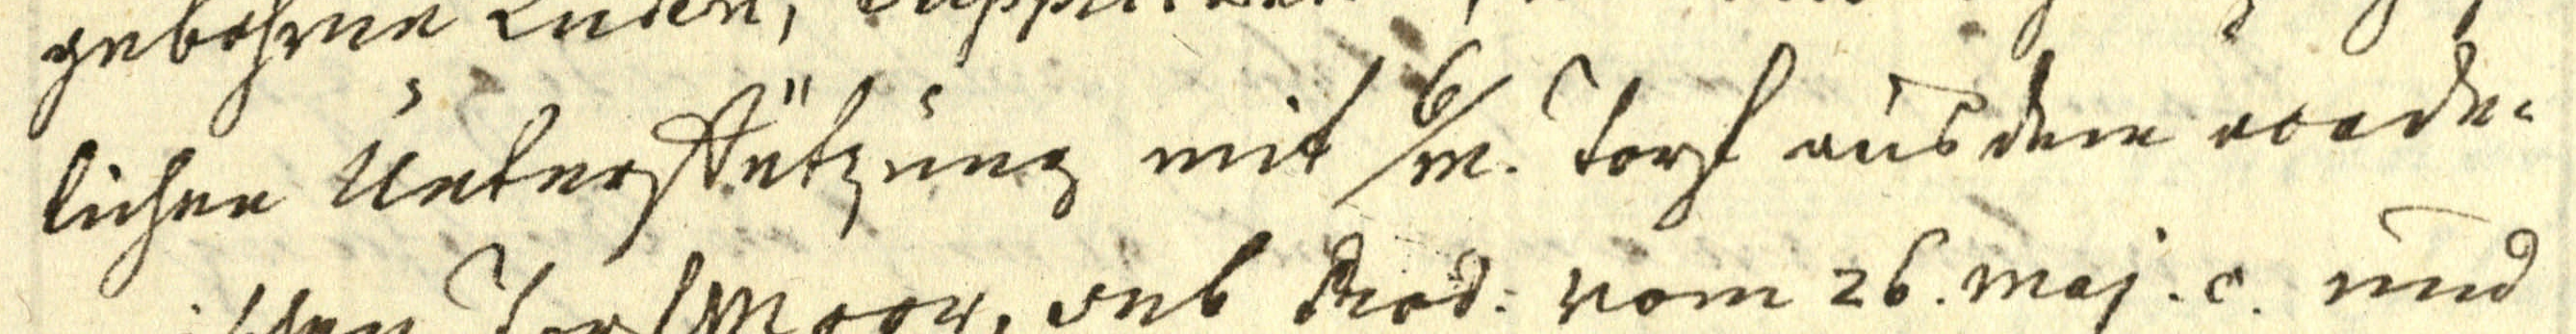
lichen Unterstützung mit 6/m Torf aus dem acade¬
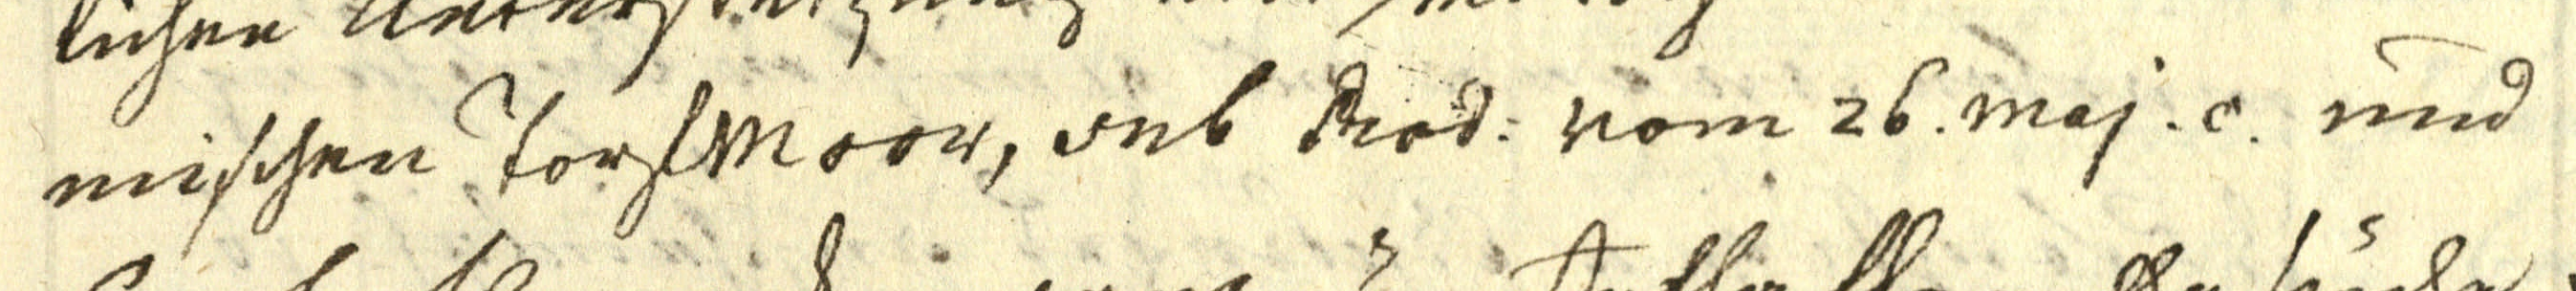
mischen TorfMoor, sub Prod. vom 26 maj. c. und
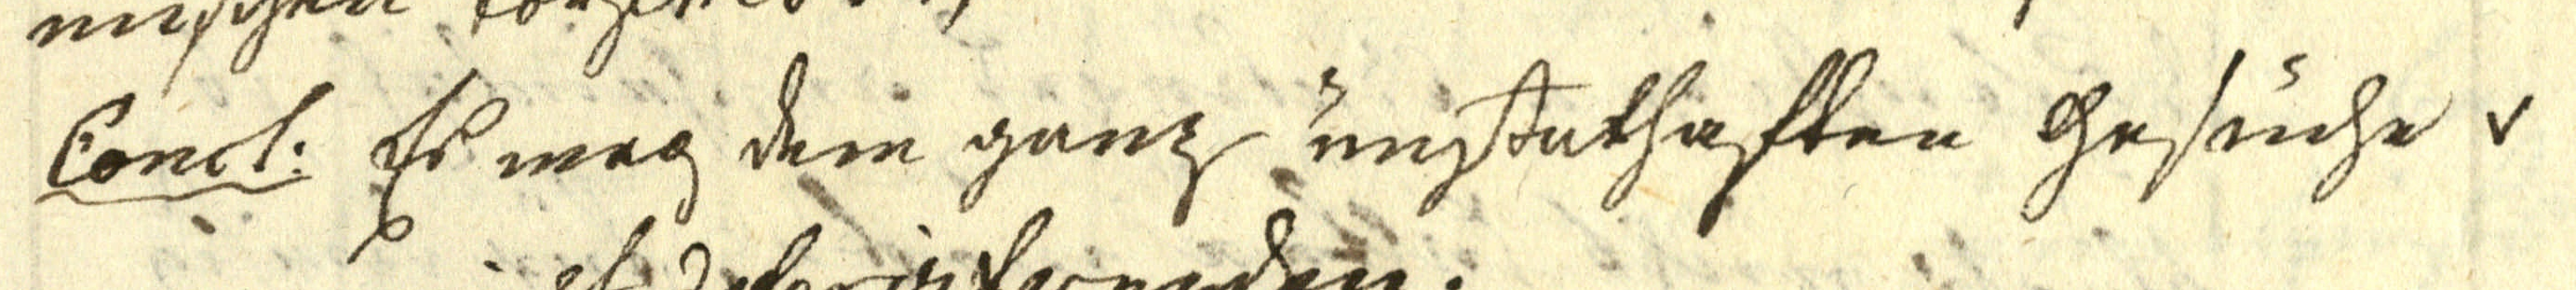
Concl. Es mag dem ganz unstathaften Gesuche
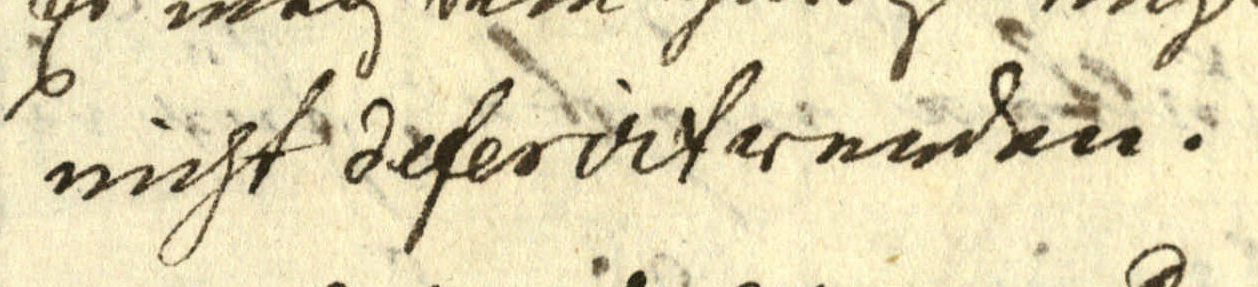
nicht deferirt werden.
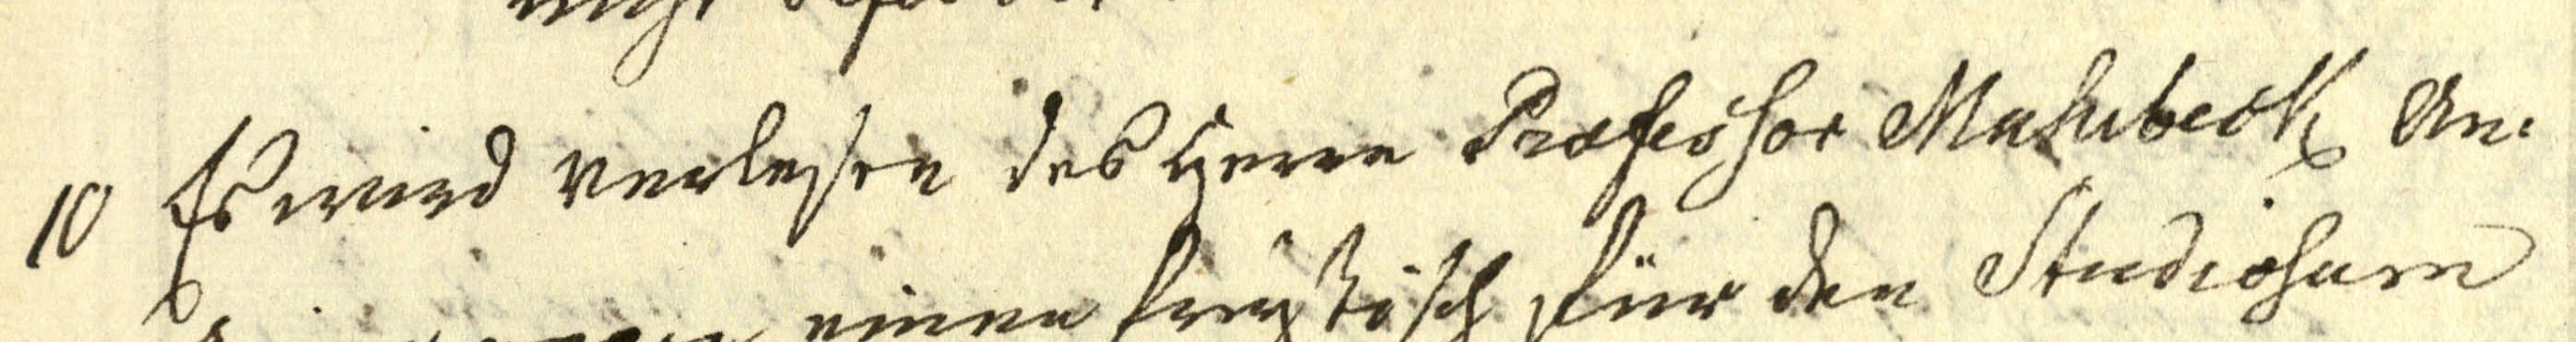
10 Es wird verlesen des Herrn Professor Muhrbeck An¬
